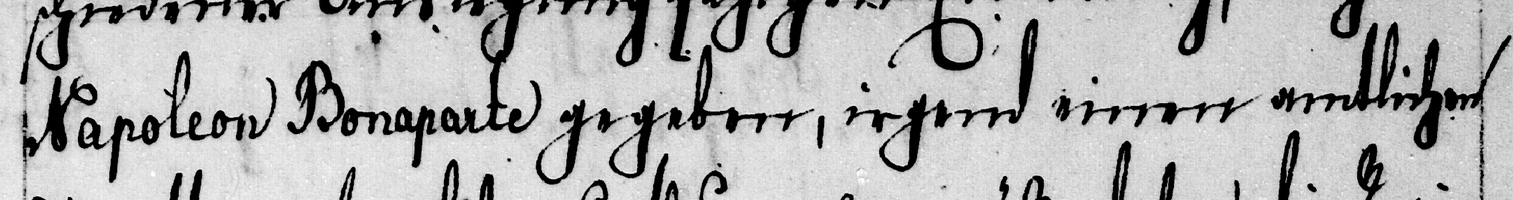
Napoleon Bonaparte gegeben, irgend einen amtlichen
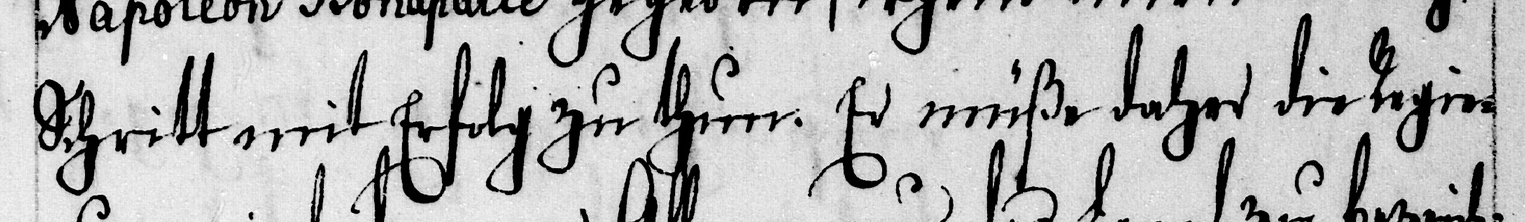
Schritt mit Erfolg zu thun. Er müße daher die Regie¬
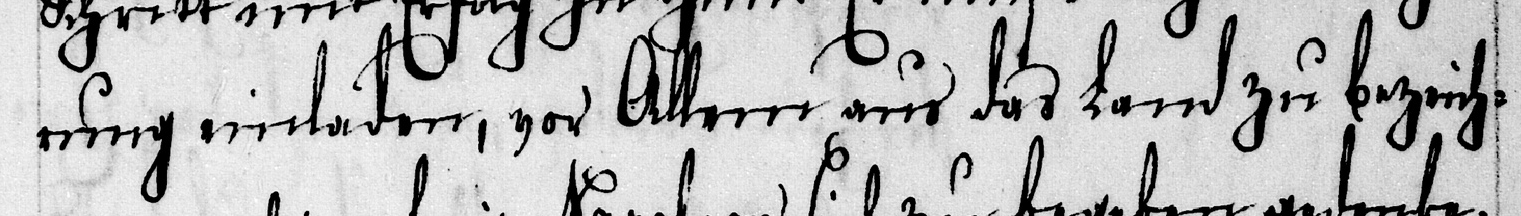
rung einladen, vor Allem aus das Land zu bezeic¬
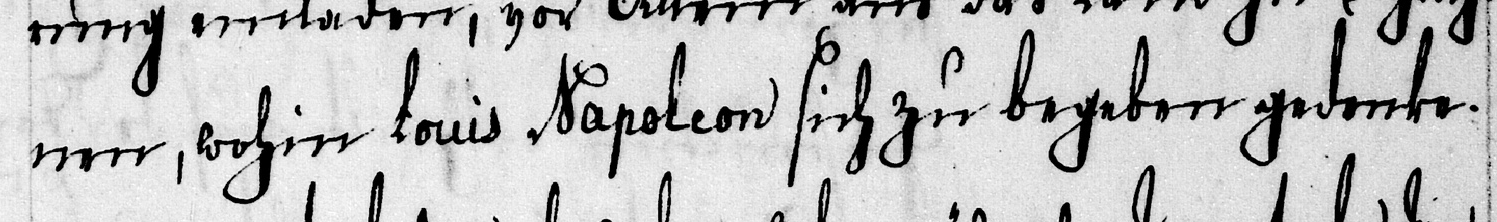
hnen, wohin Louis Napoleon sich zu begeben gedenke.
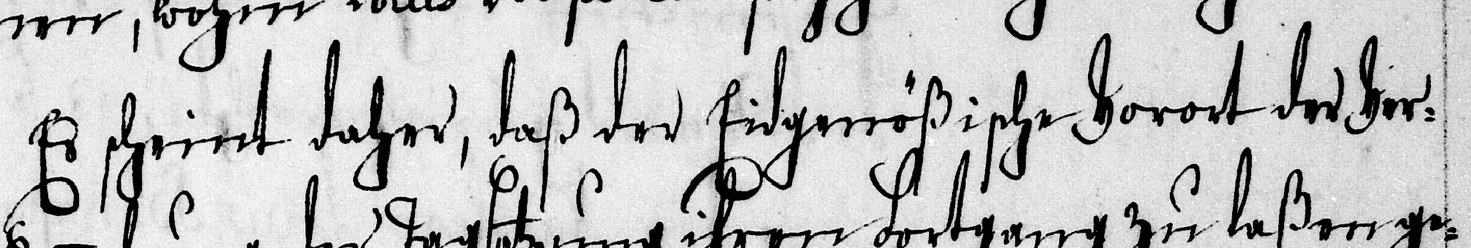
Es scheint daher, daß der Eidgenößische Vorort der Ver¬
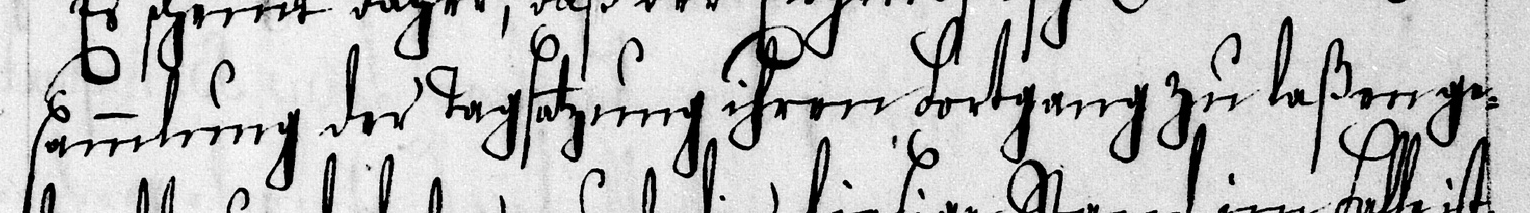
sammlung der Tagsatzung ihren Fortgang zu laßen ge¬
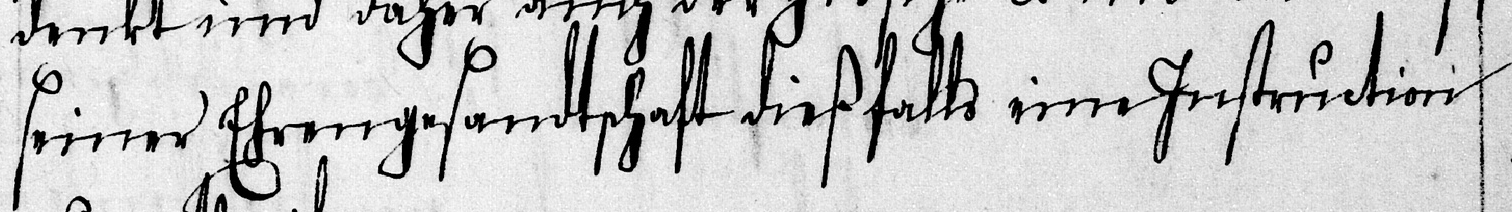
seiner Ehrengesandtschaft dießfalls eine Instruction
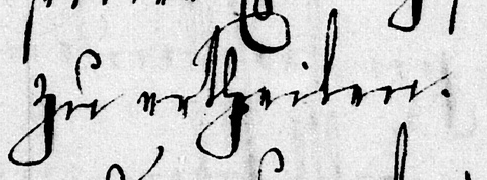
zu ertheilen.
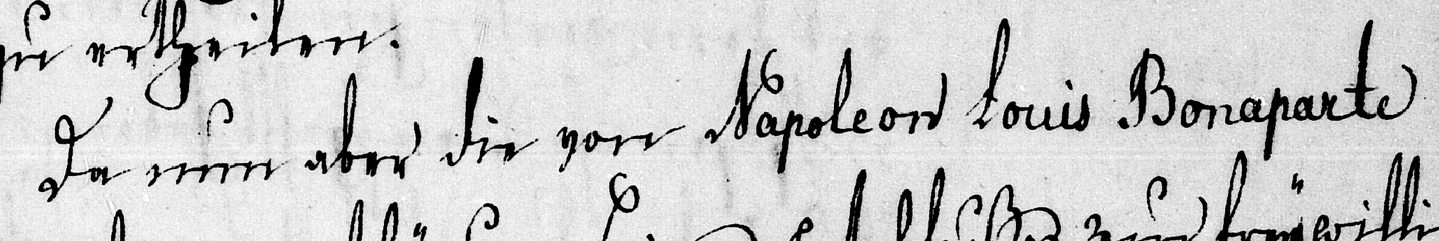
Da nun aber die von Napoleon Louis Bonaparte
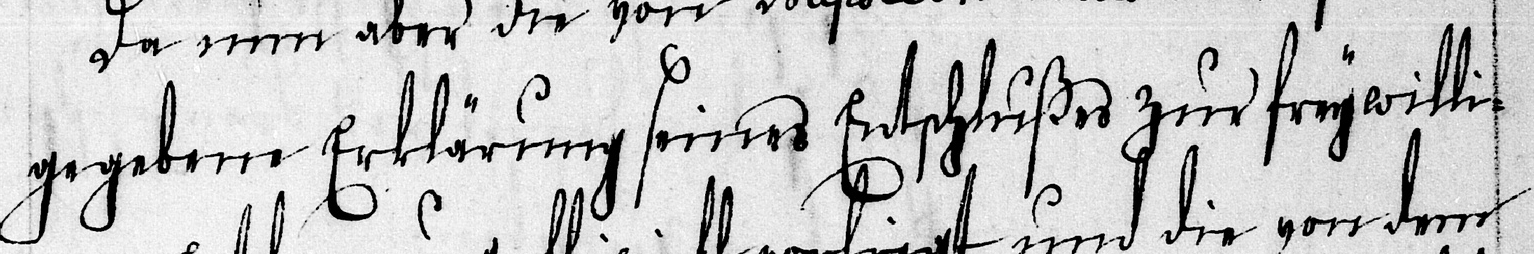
gegebene Erklärung seines Entschlußes zur freywilli¬
